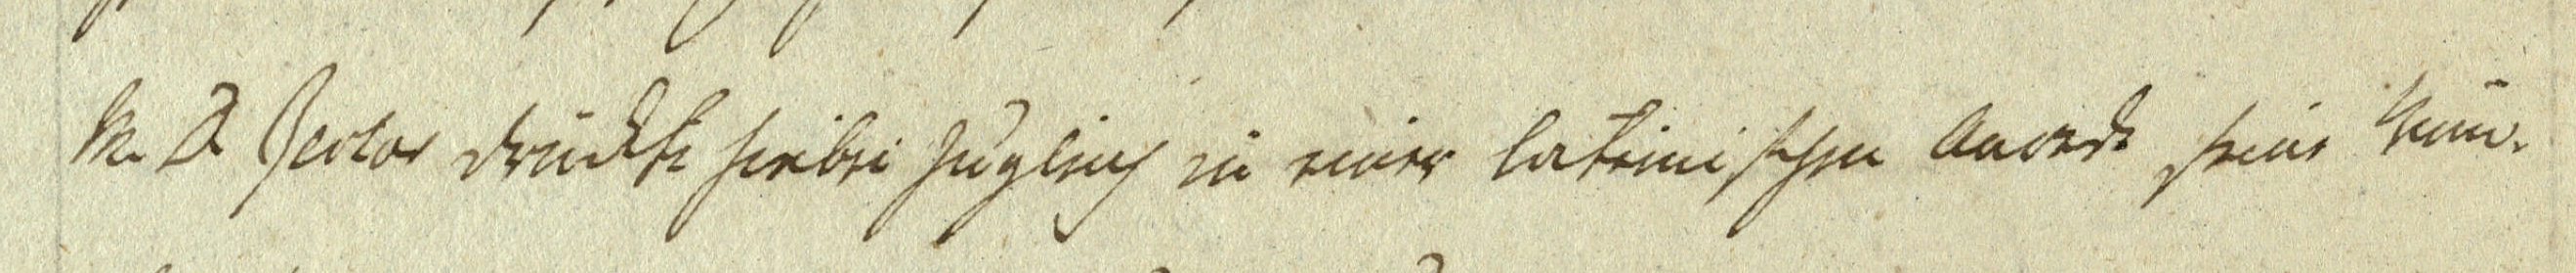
M. D. Rector drückte hiebei zugleich in einer lateinischen Anrede seine Wün¬
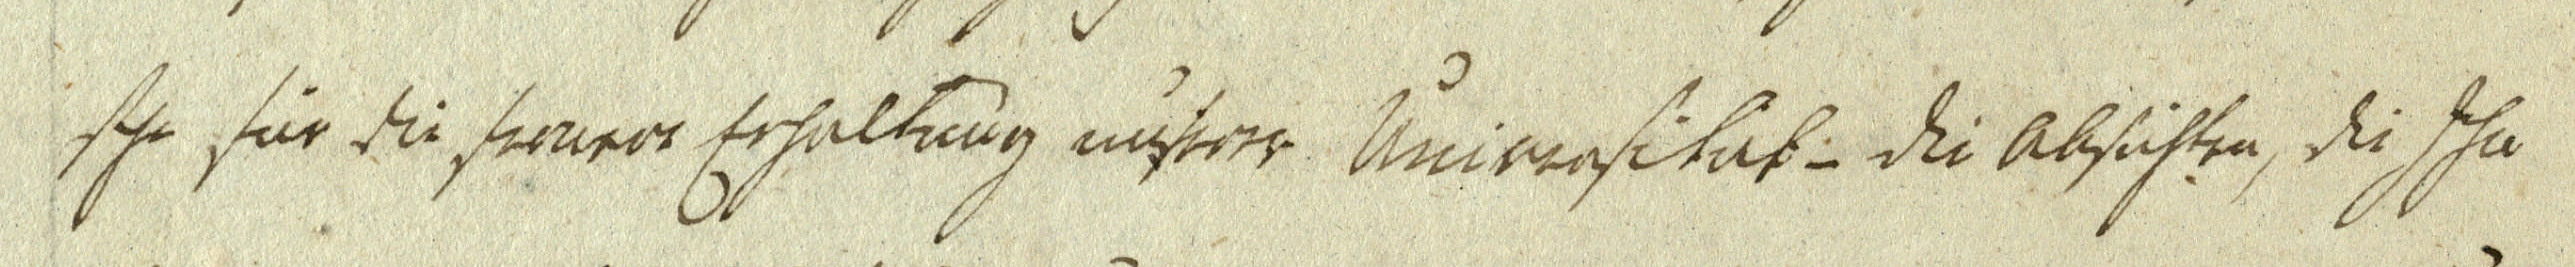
sche für die fernere Erhaltung unter Universität - die Absichten, die Ihn
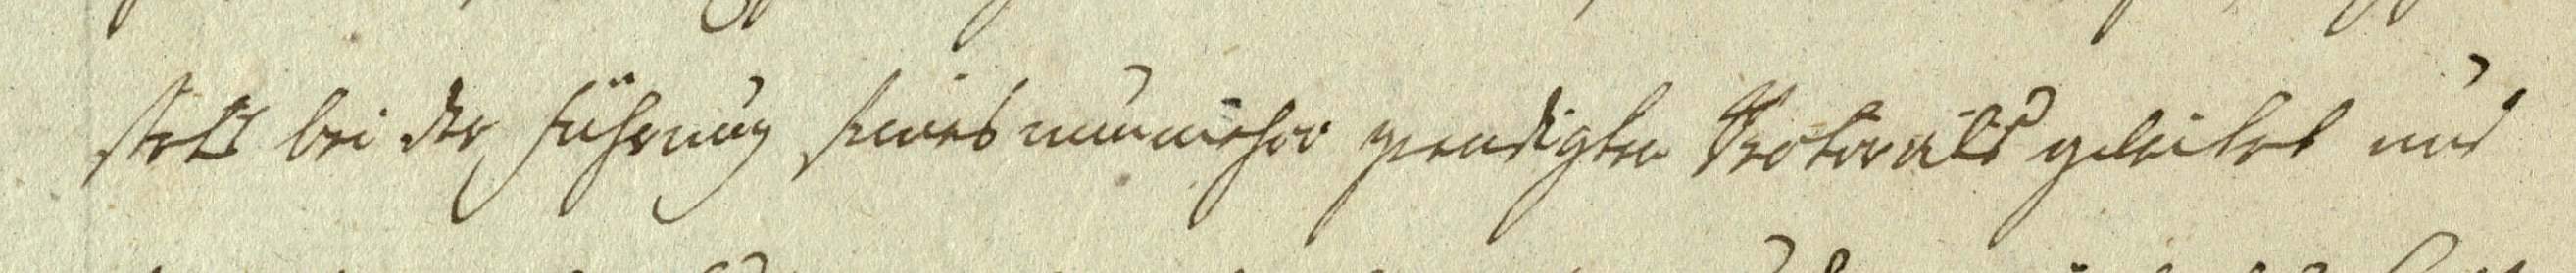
stets bei der Führung seines nunmehro geendigten Rectorats geleitet und
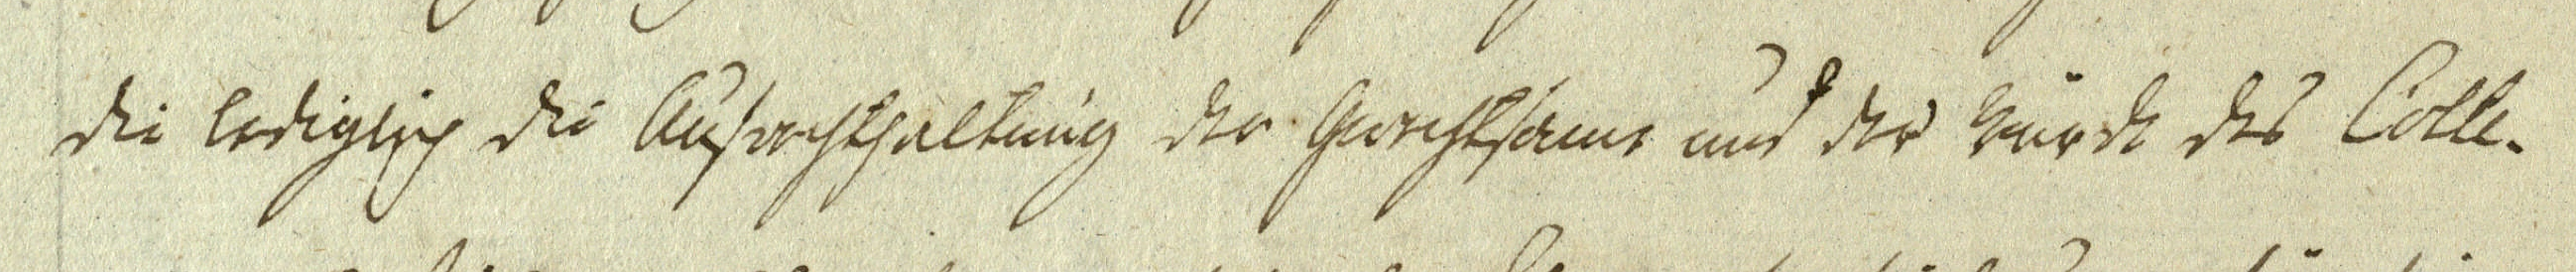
die lediglich die Aufrechthaltung der Gerechtsame und der Würde des Colle¬
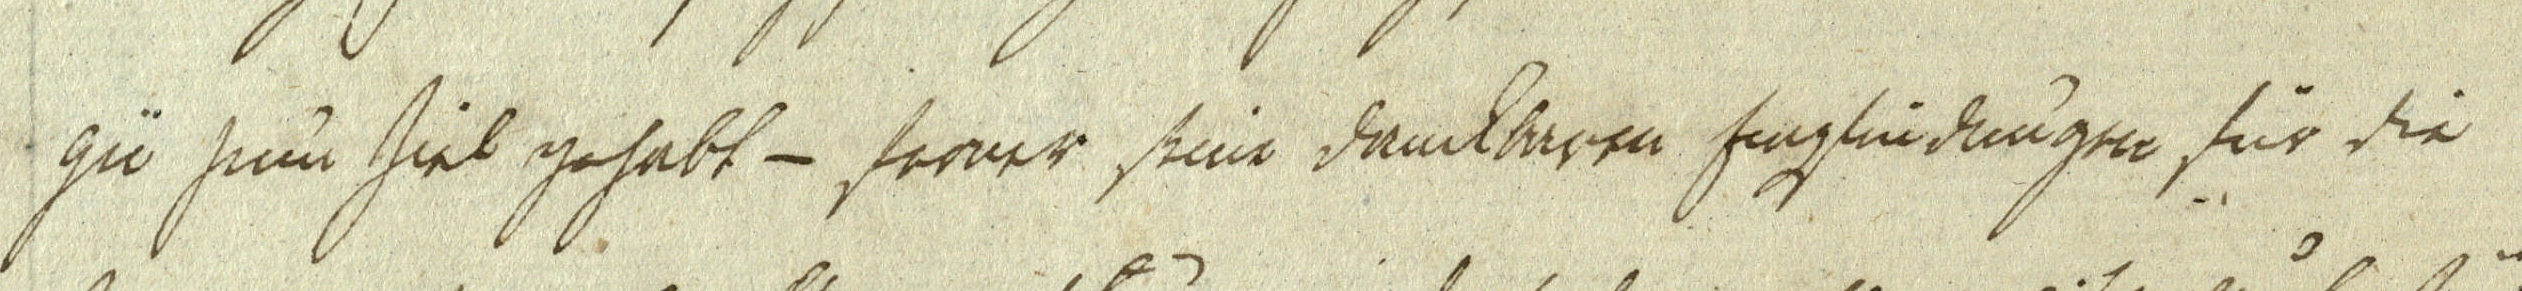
gii zum Ziel gehabt - ferner seine danckbaren Empfindungen für die
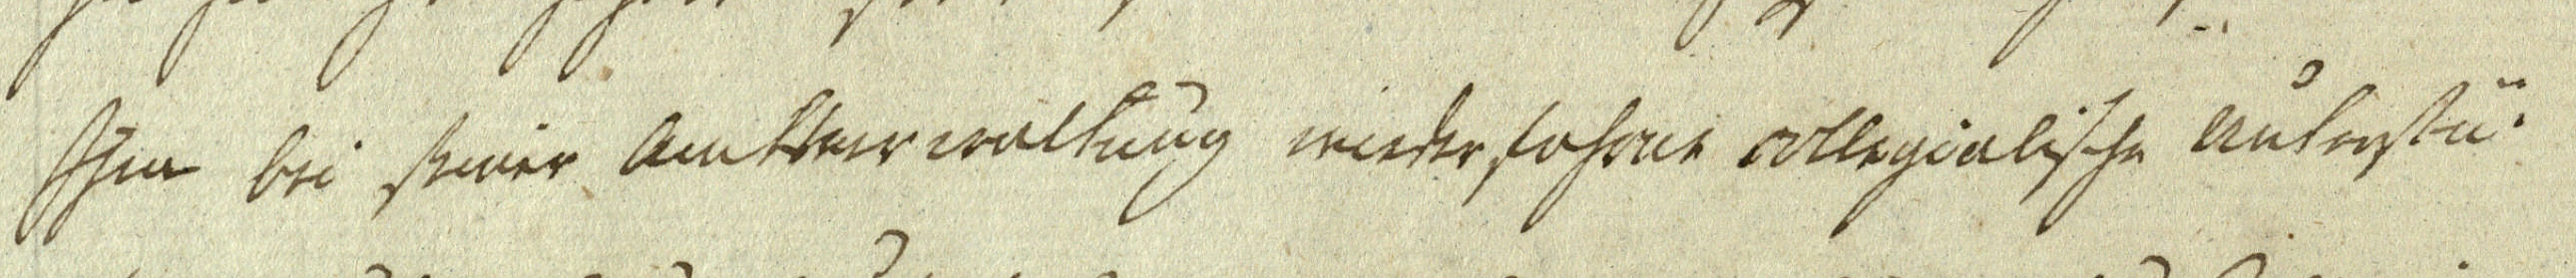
Ihm bei seiner Amtsverwaltung wiederfahrne collegialische Unterstü¬
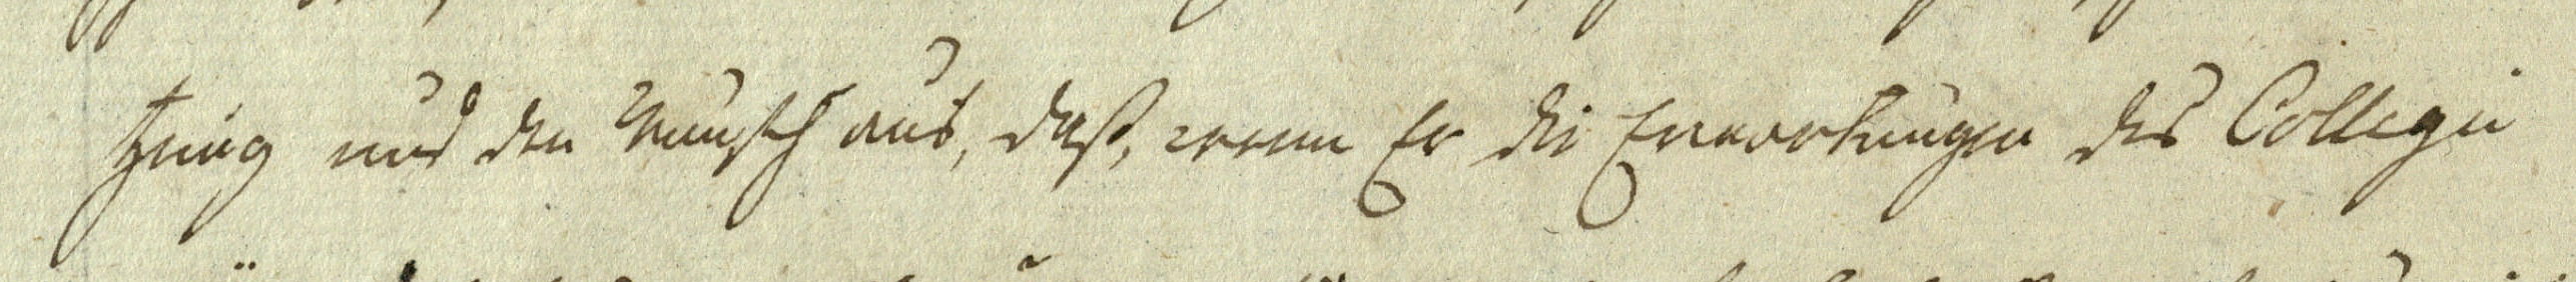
tzung und den Wunsch aus, daß, von Er die Erwartungen des Collegii
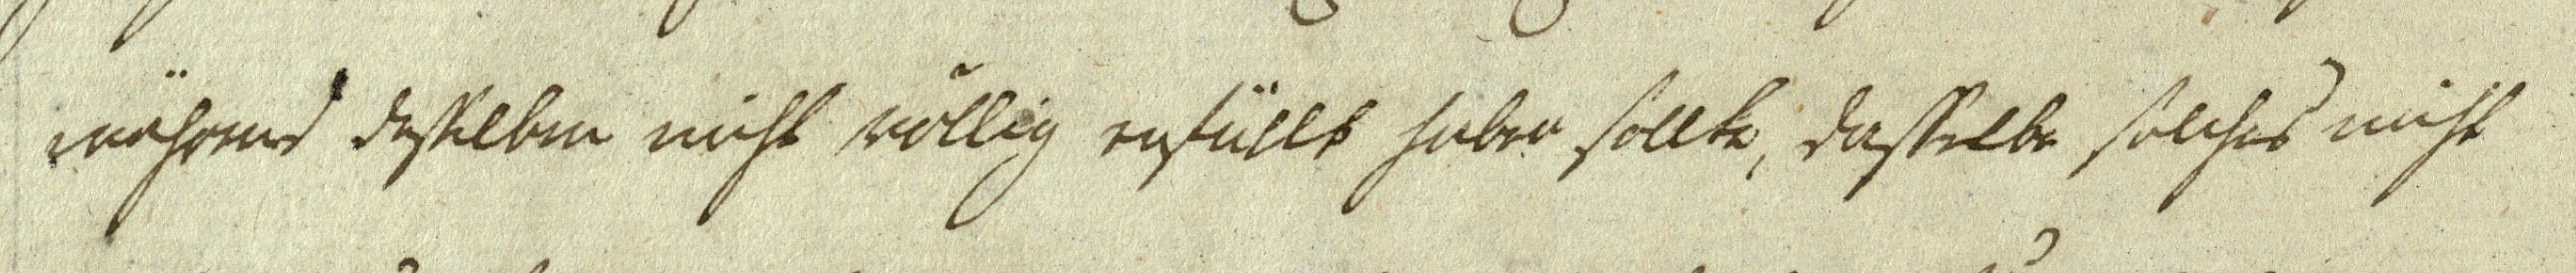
während desselben nicht völlig erfüllt haben sollte, dasselbe solches nicht
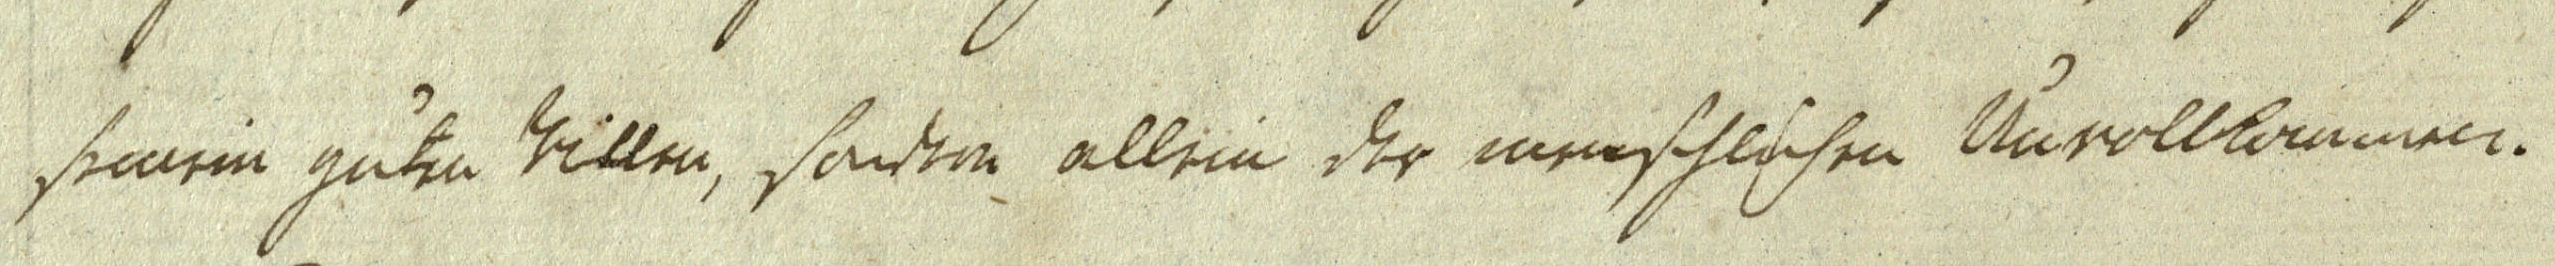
seinem guten Willen, sondern allein der menschlichen Unvollkommen¬
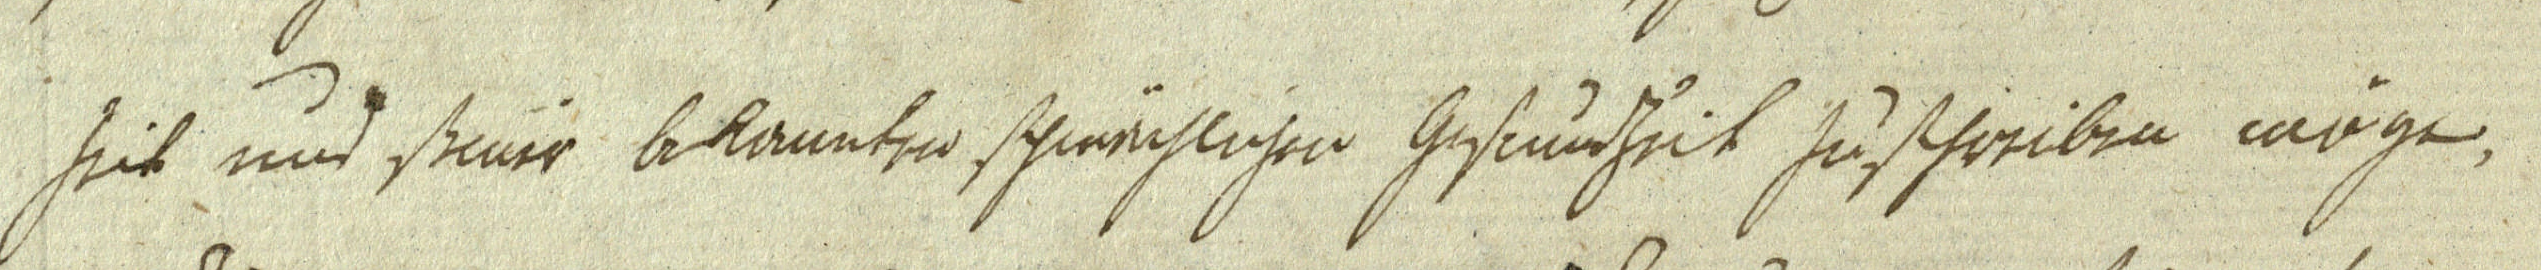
heit und seiner bekannten schwächlichen Gesundheit zuschreiben möge,
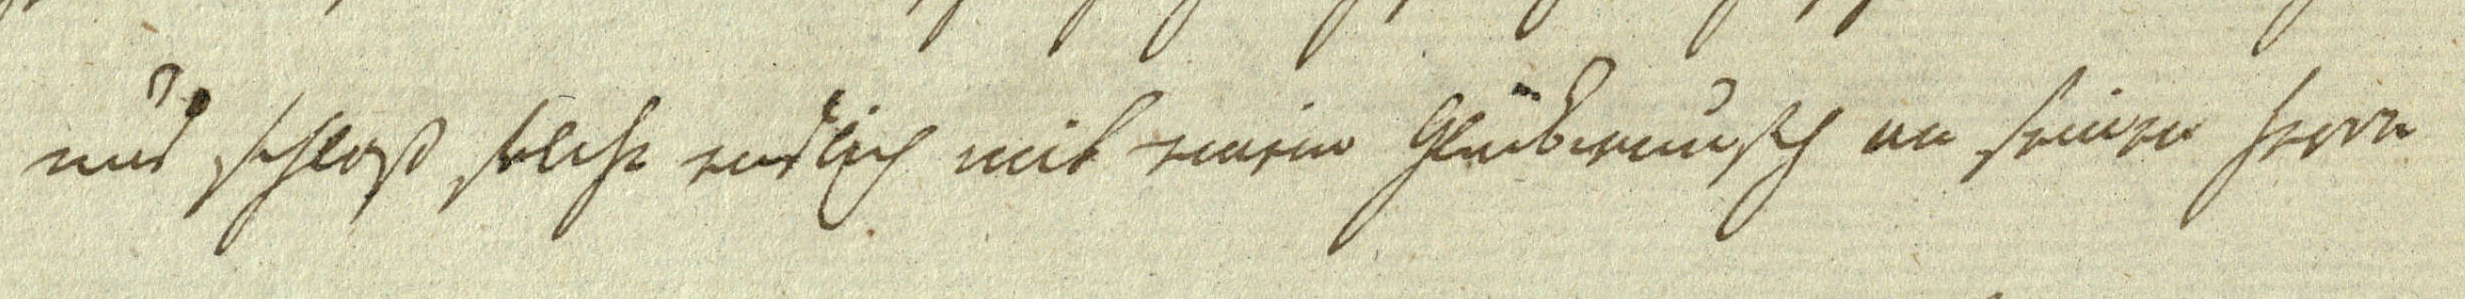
und schloß solche endlich mit einem Glückwunsch an seinen Herrn
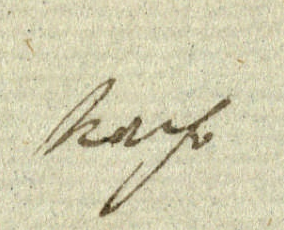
Nach¬
